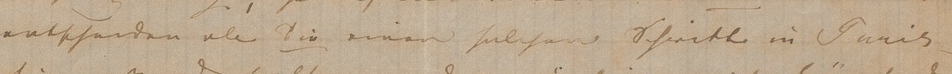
entscheiden ob Sie einen solchen Schritt in Paris
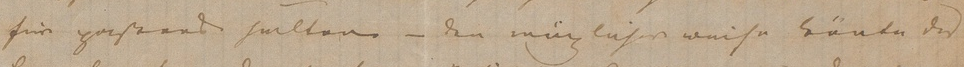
für paßend halten – den möglicherweise könte das
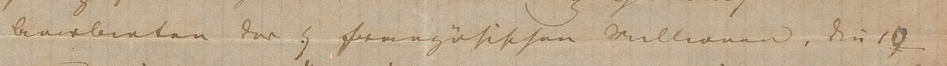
Anerbieten der 9 französischen Millionen, die 10
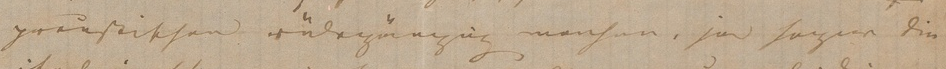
preußischen rükgängig machen, ja sogar die
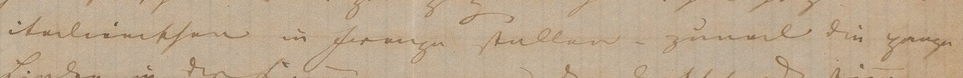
italienischen in Frage stellen – zumal die ganze
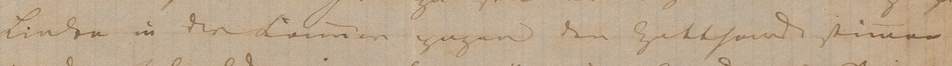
Linke in der Kammer gegen den Gotthard stimmen
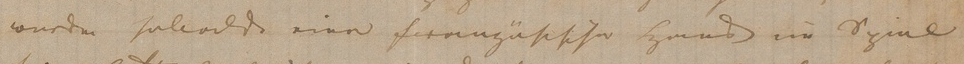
werde sobald eine französische Hand im Spiel
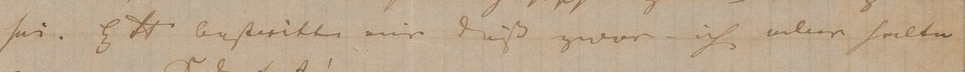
sei.» Herr St bestritt mir dieß zwar – ich aber halte
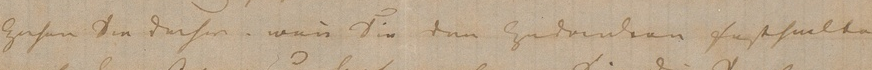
«Gehen Sie daher – wenn Sie den Gedanken festhalten
